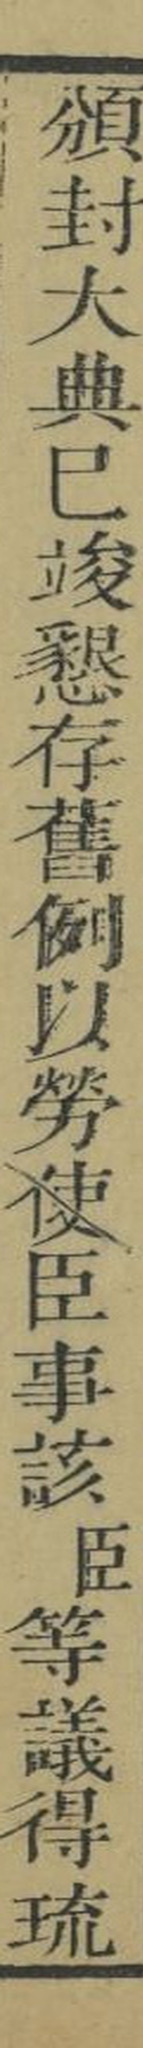領封大典巳竣懇存舊例以勞使臣事該臣等議得琉
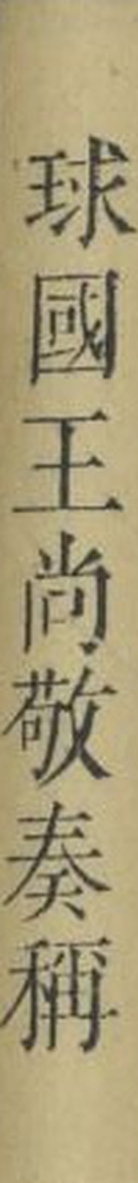球國王尚敬奏稱
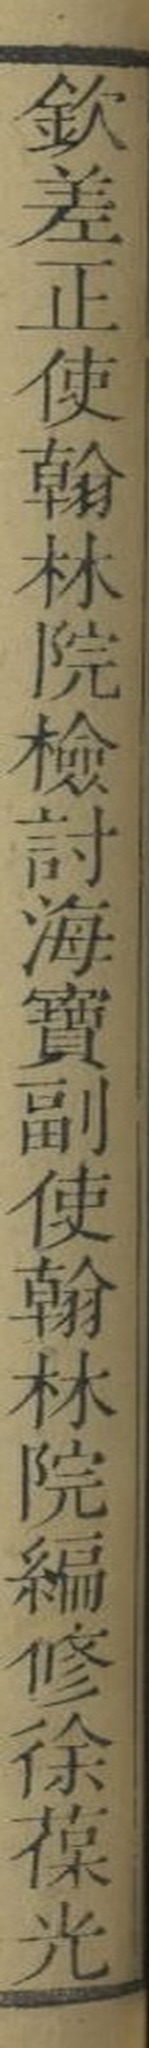欽差正使翰林院檢討海寶副使翰林院編修徐葆光
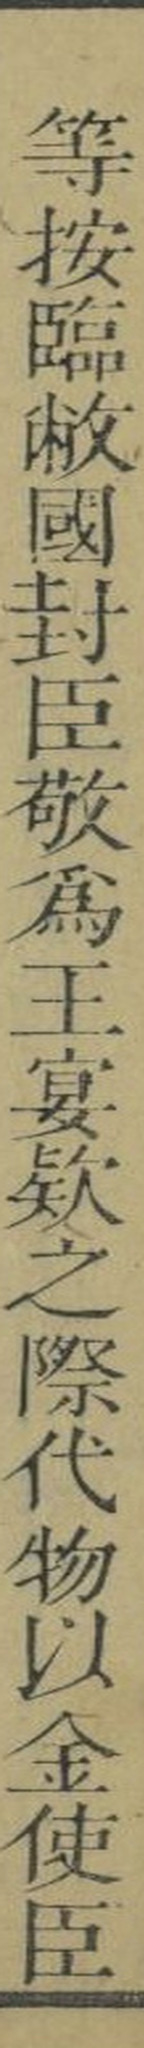等按臨敝國封臣敬爲王宴欵之際代物以金使臣
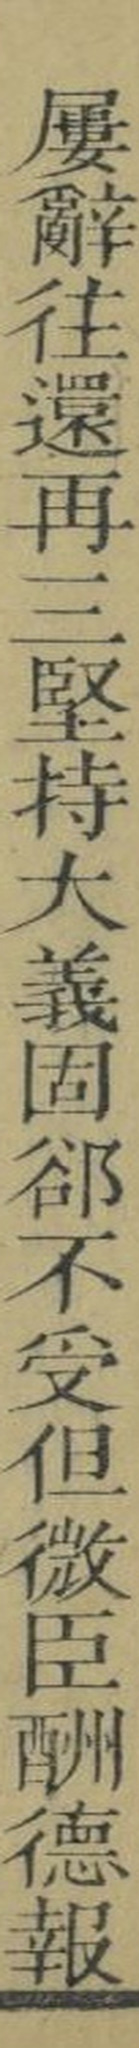屢辭往還再三堅持大義固郤不受但微臣酬德報
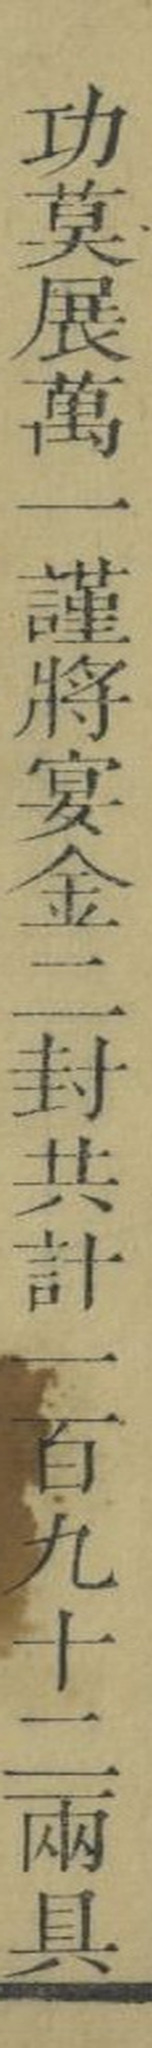功莫展萬一謹將宴金二封共計一百九十二兩具
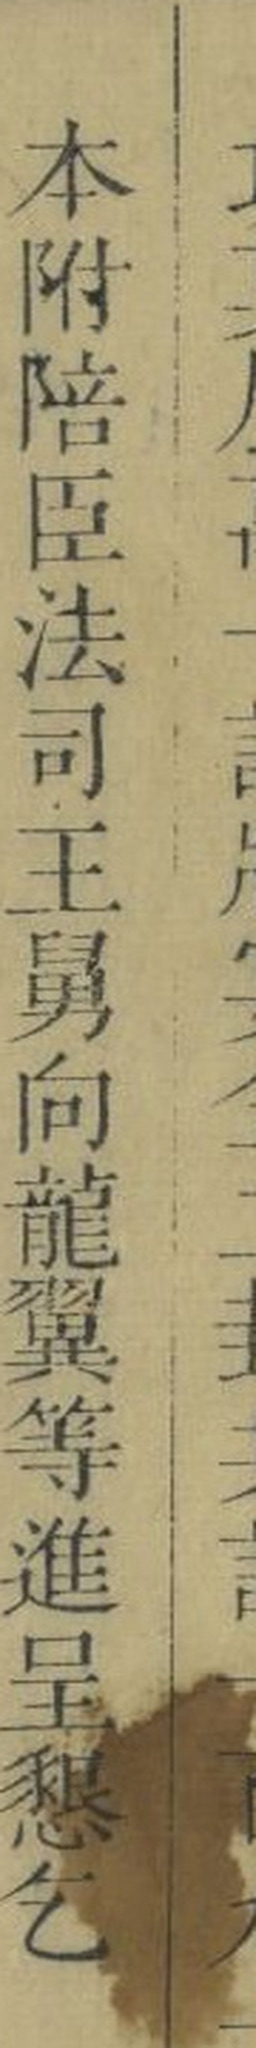本附陪臣法司王舅向龍翼等進呈懇乞
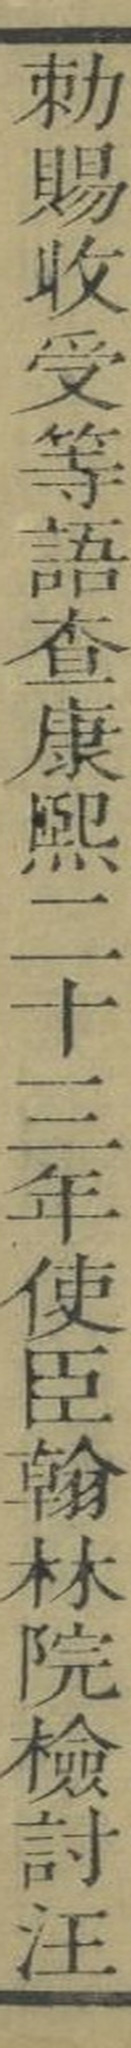勅賜收受等語査康煕二十三年使臣翰林院檢討汪
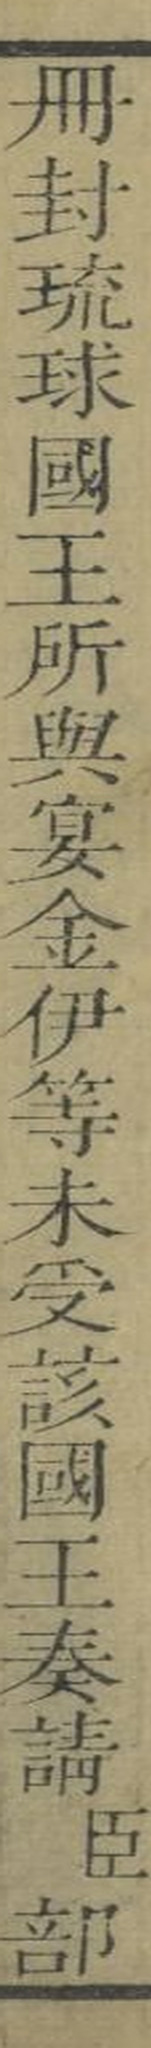冊封琉球國王所與宴金伊等未受該國王奏請臣部
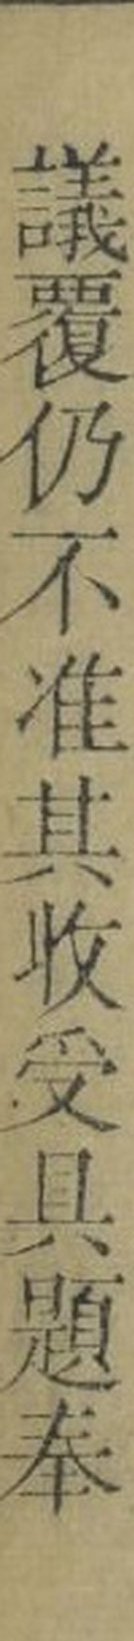議覆仍不准其收受具題奉

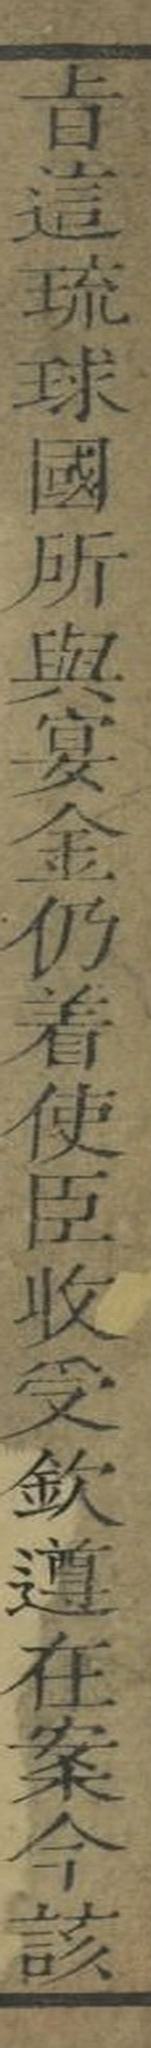㫖這琉球國所與宴金仍着使臣收受欽遵在案今該
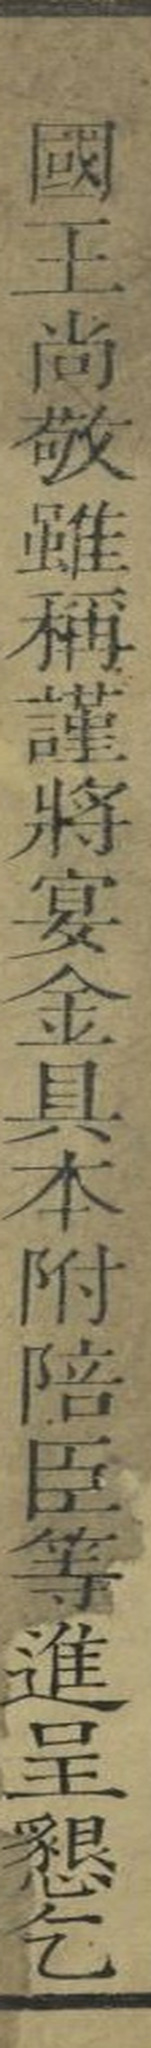國王尚敬雖稱謹將宴金具本附陪臣等進呈懇乞
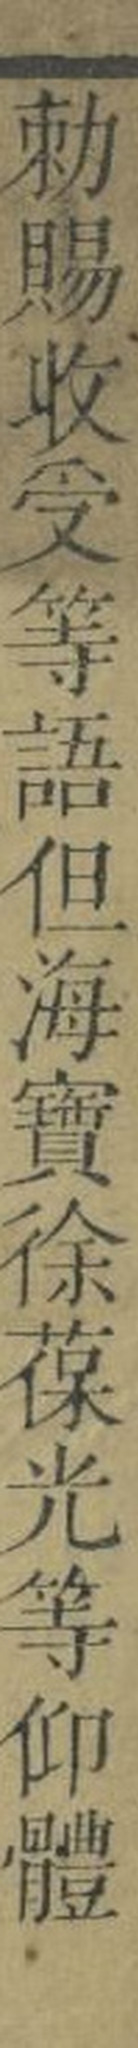勅賜收受等語但海寶徐葆光等仰體
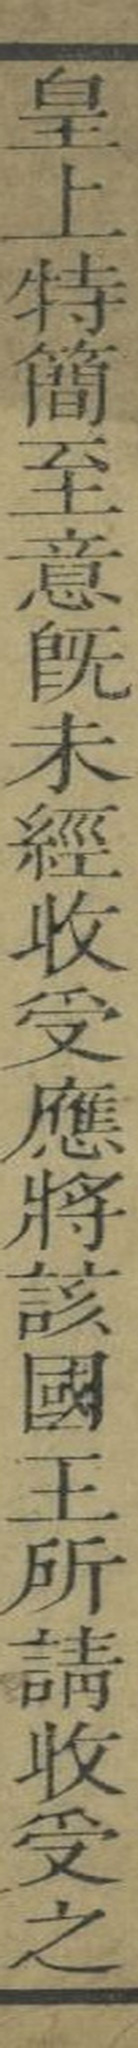皇上特簡至意既未經收受應將該國王所請收受之
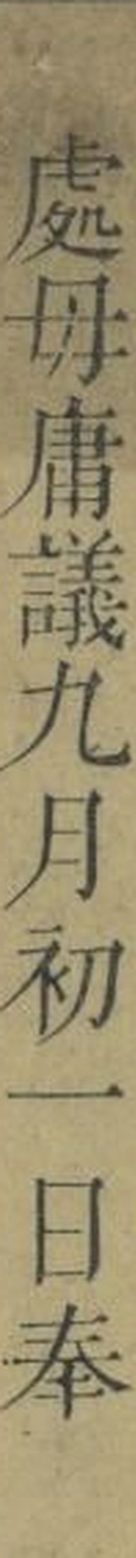處母庸議九月初一日奉
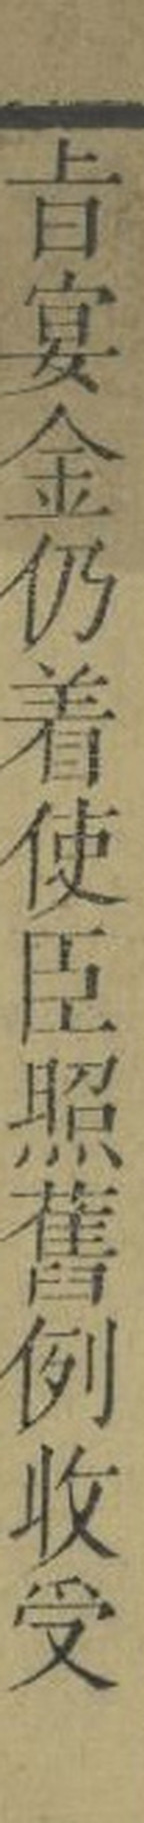㫖宴金仍着使臣照舊例收受
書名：中山伝信録 巻二
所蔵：University of the Ryukyus Library
